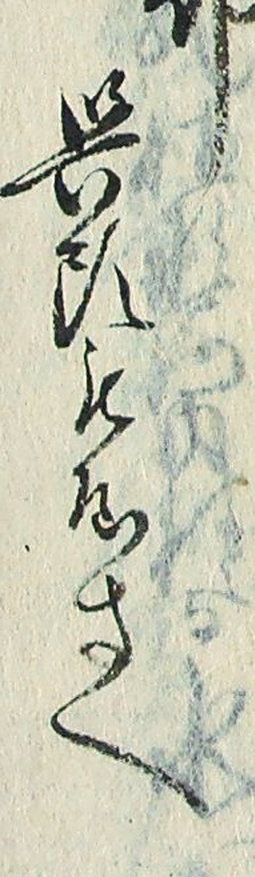與頭庄屋方へ

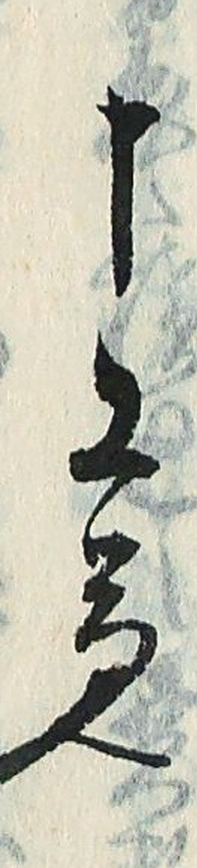申上覚
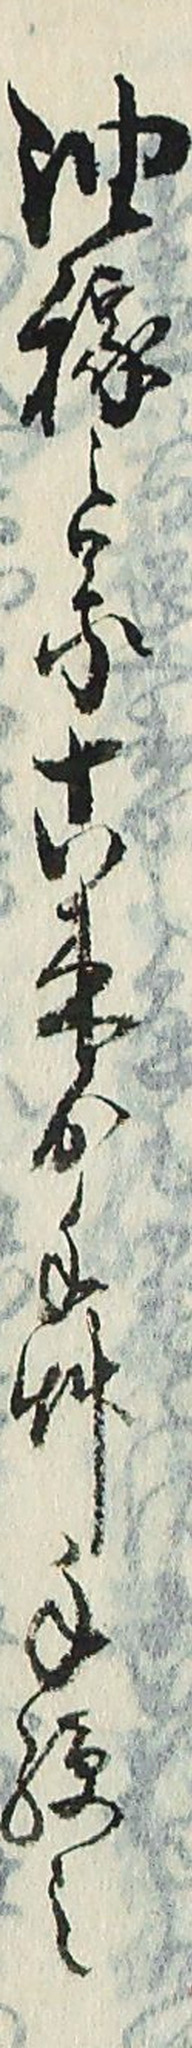油稼之義古来ゟ手艸手絞之
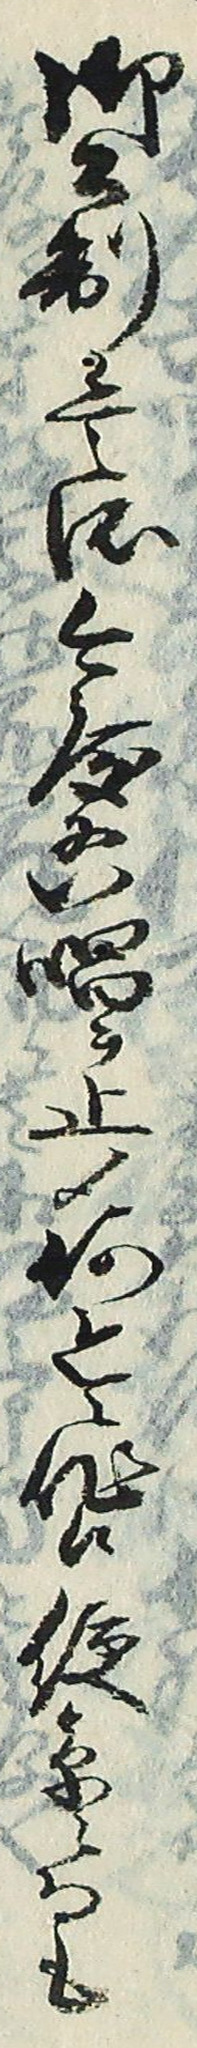御公制有之所今度右唱を止め何者之作候絞草にても
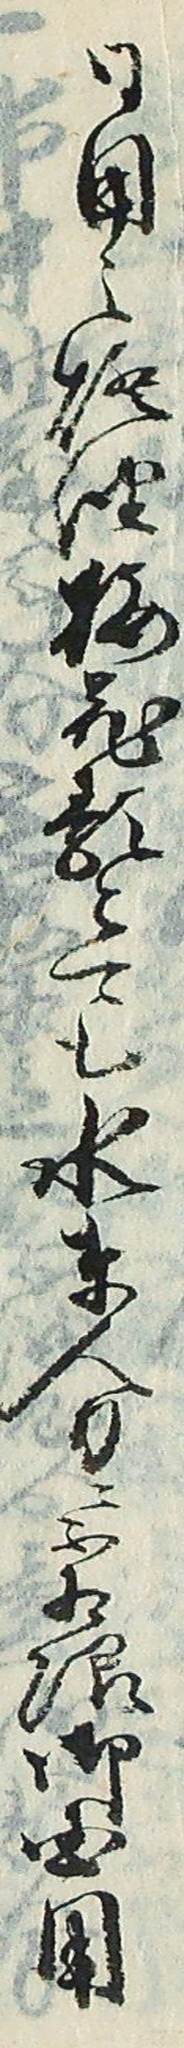日用の燈油梅花類とても水車人力に不相限御国用
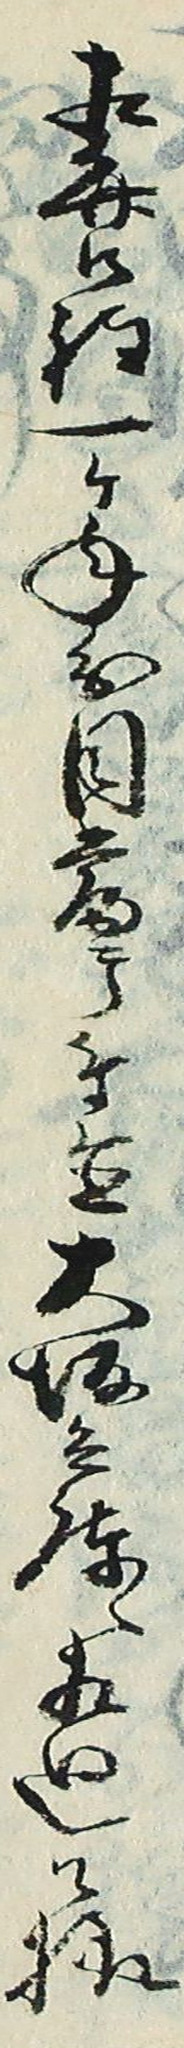相弁候種一カ年分目当て付置大坂兵庫へ相廻候様
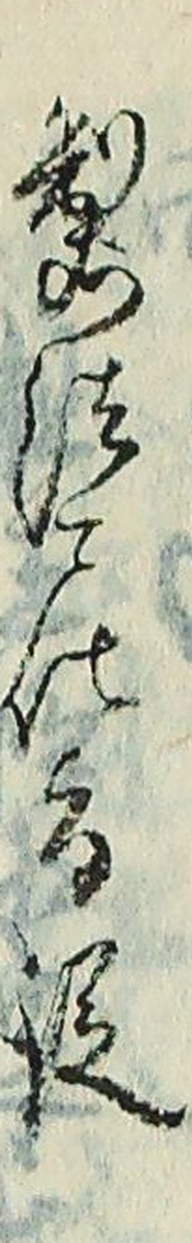製法可仕旨従
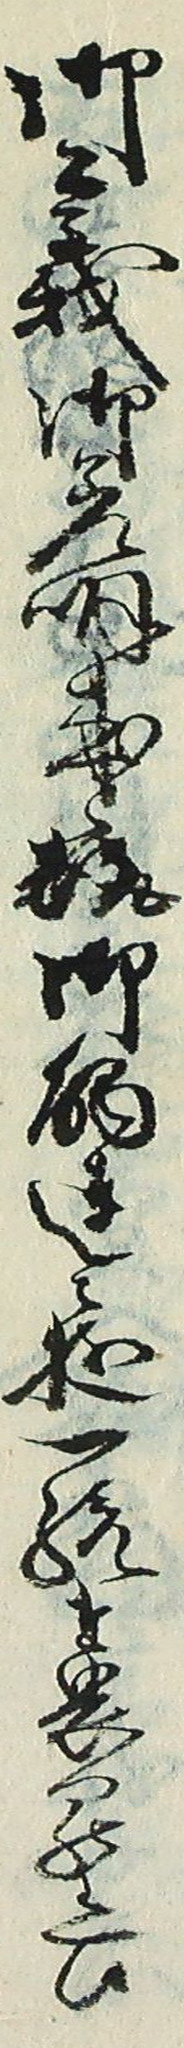御公義御差明来候趣御触達被遊一統奉畏罷有候
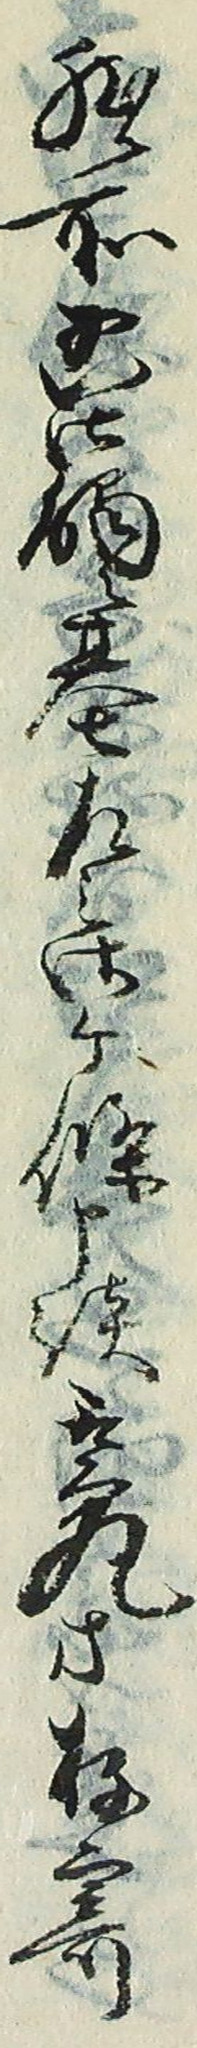然る所右御触之基左之御ケ條申談取究方存寄
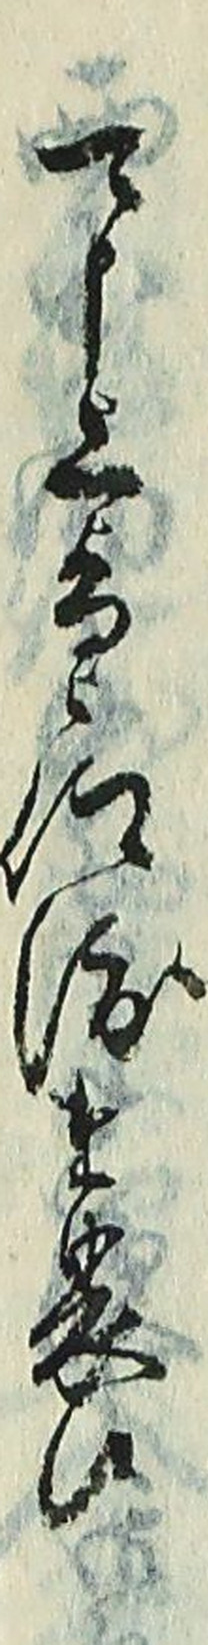可申上旨被仰渡奉畏候
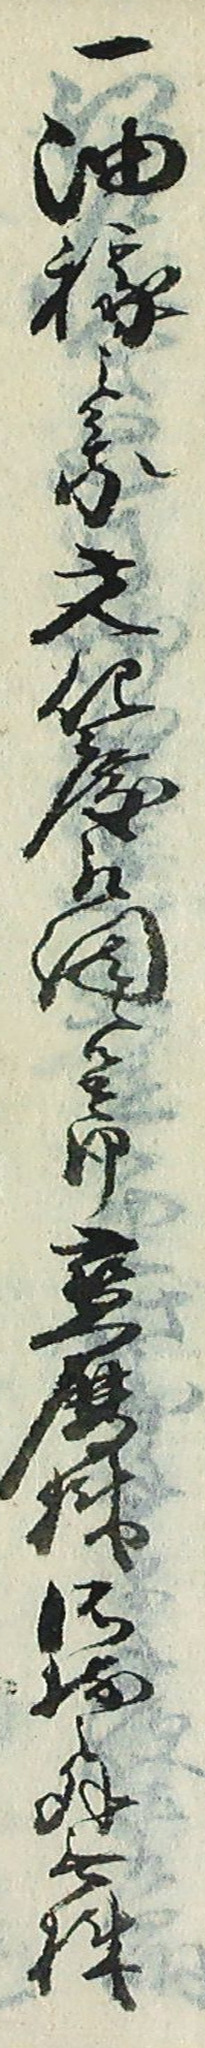一油稼之義文化度取調へ候節宝暦株所持之外無株
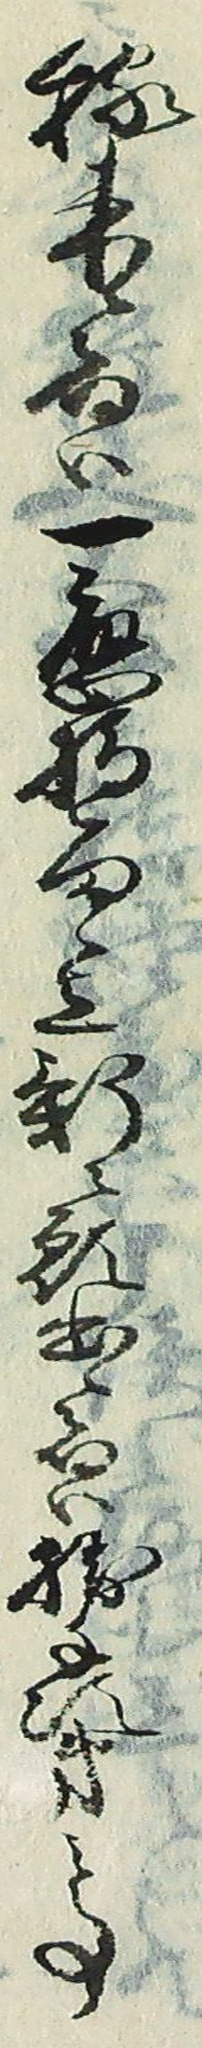稼来候者は一応指留候上新に願出候者は勝手次第之事
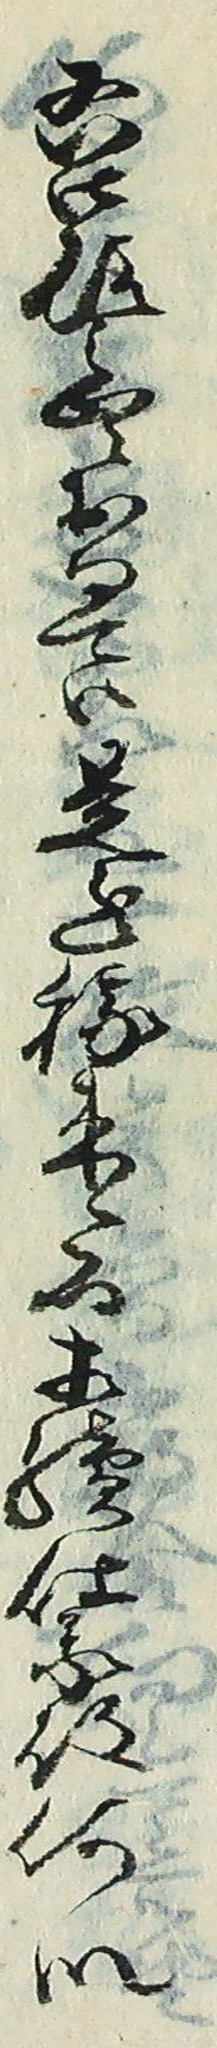右御趣意におゐては是迄稼来候者相続仕義故何以
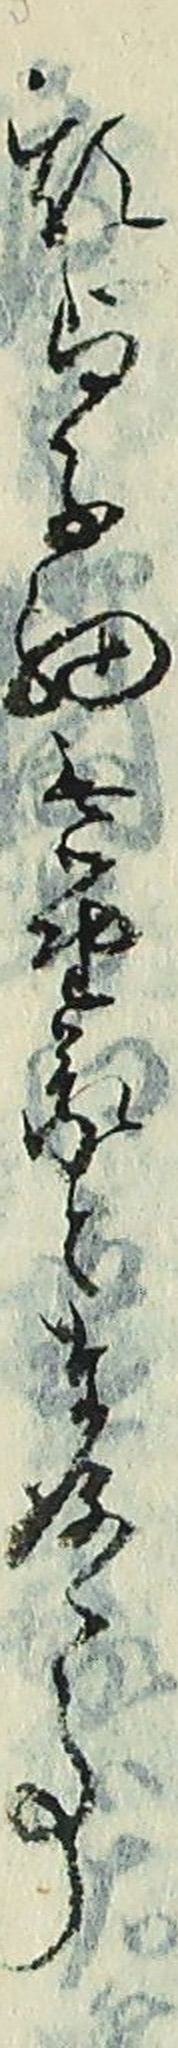煩布子細無御坐義と奉存候事
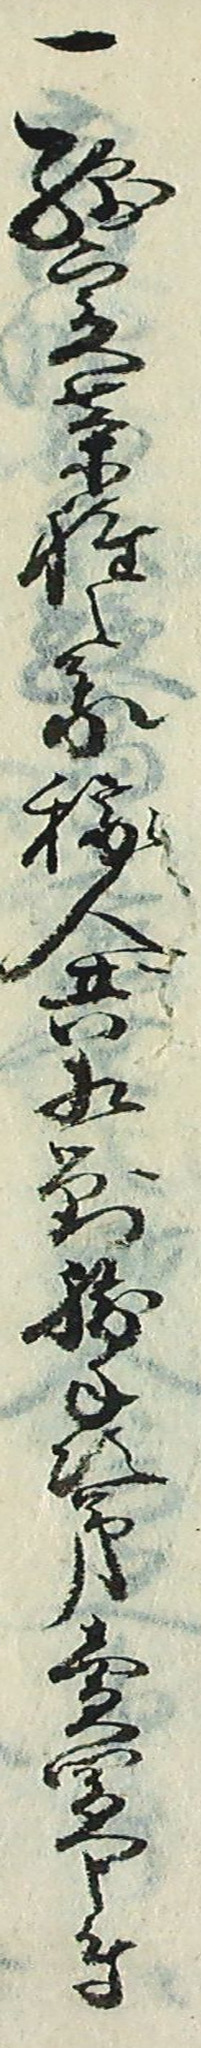一綿実菜種之義稼人共相対勝手次第売買申付
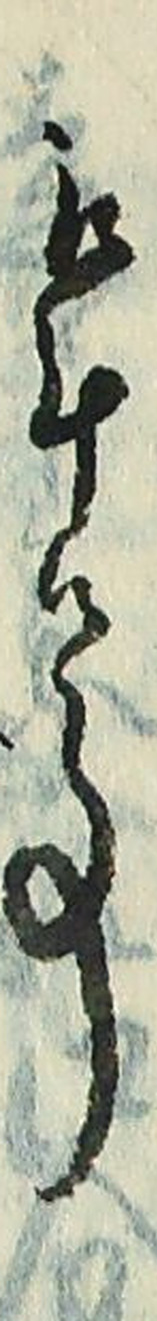取計候事
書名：油稼御取究ニ附御箇條書テ以被仰渡南北同役申談御答書控
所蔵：鳴門教育大学 Naruto University of Education
